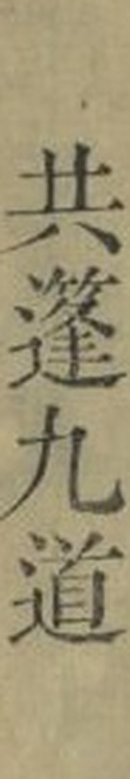共篷九道
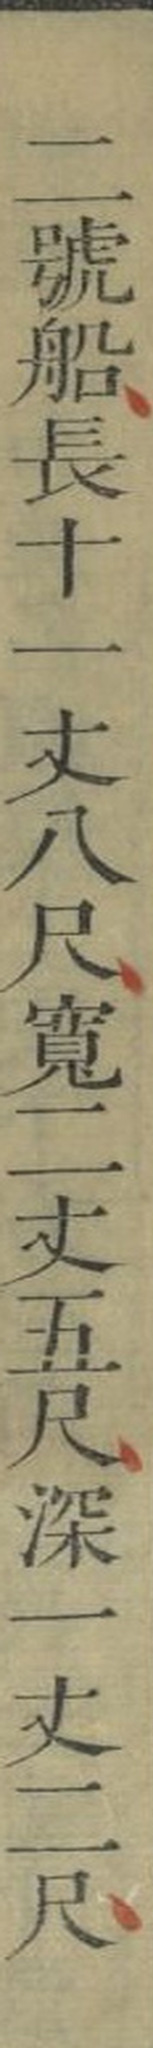二號船長十一丈八尺寬二丈五尺深一丈二尺
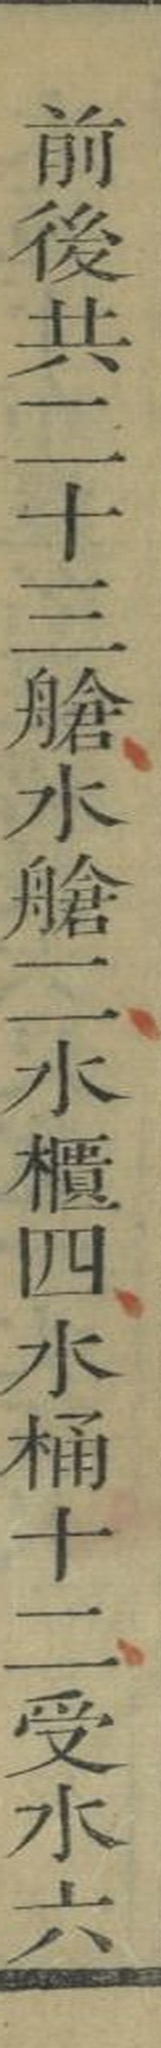前後共二十三艙水艙二水櫃四水桶十二受水六
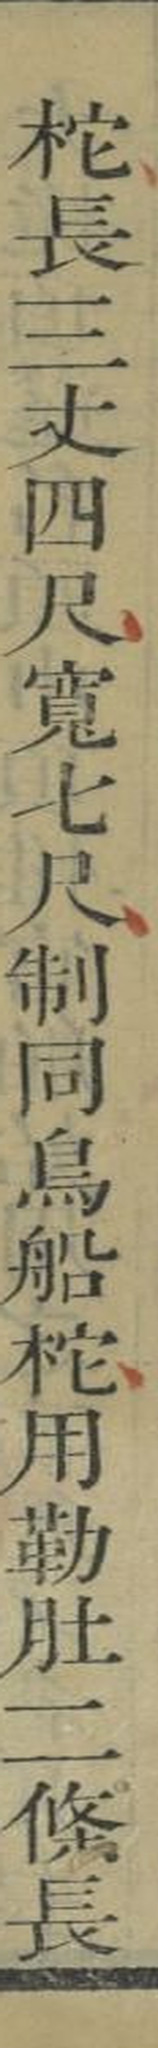柁長三丈四尺寬七尺制同鳥船柁用勒肚二條長
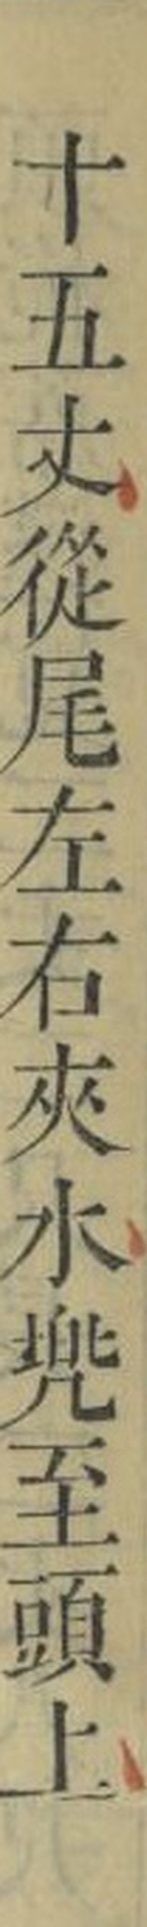十五丈從尾左右夾水兠至頭上
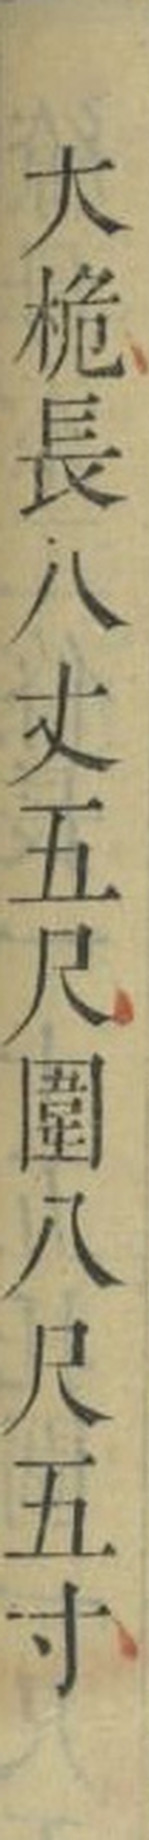大桅長八丈五尺圍八尺五寸
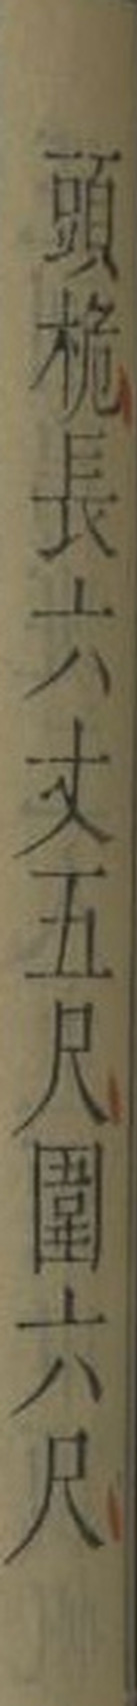頭桅長六丈五尺圍六尺
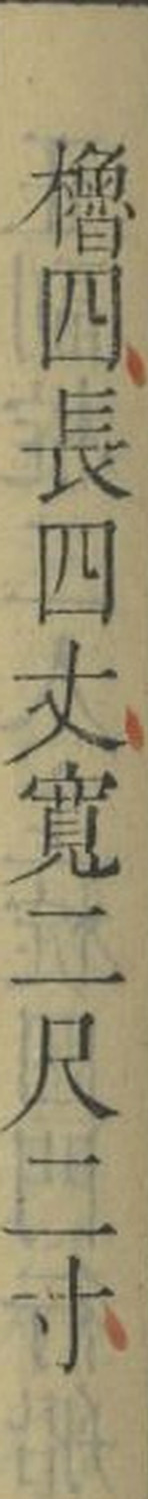櫓四長四丈寬二尺二寸
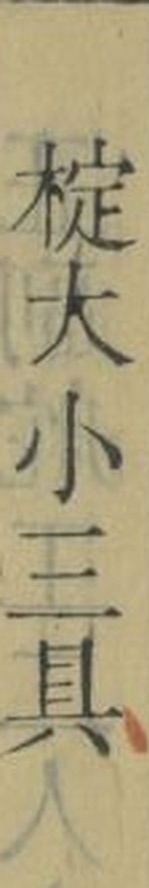椗大小三具
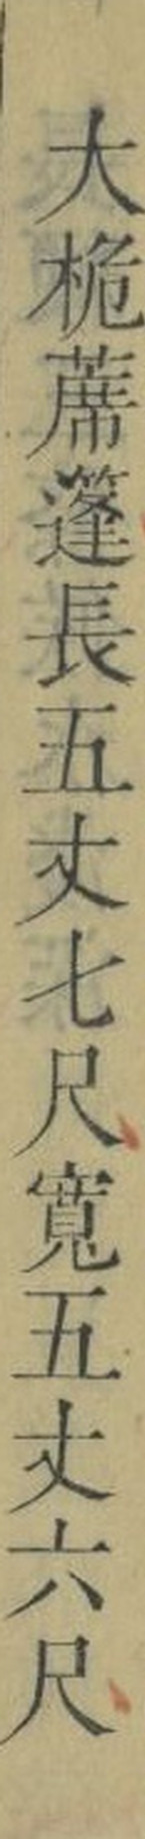大桅蓆篷長五丈七尺寬五丈六尺
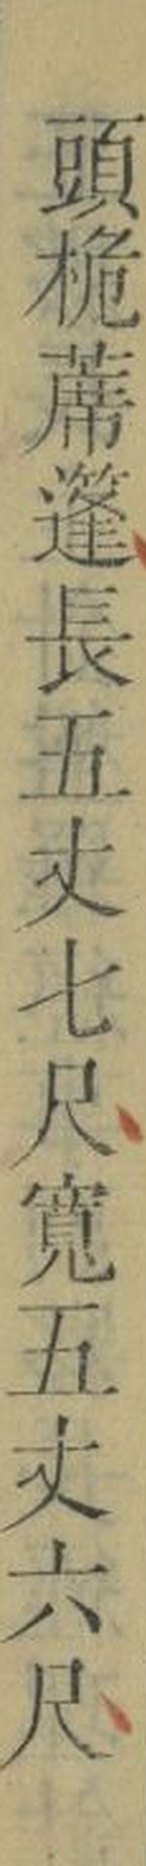頭桅蓆篷長五丈七尺寬五丈六尺
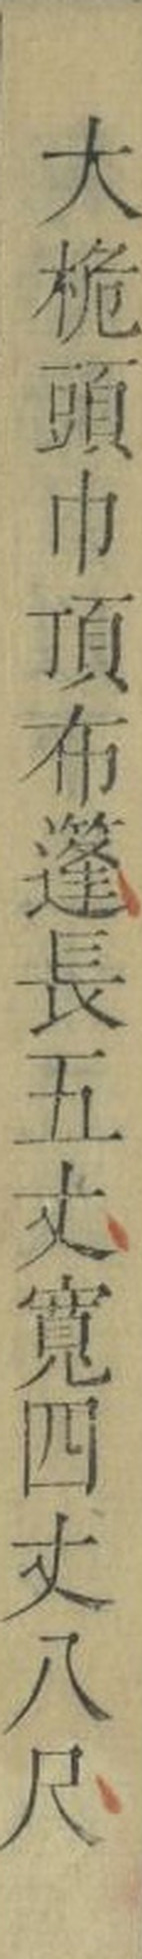大桅頭巾頂布篷長五丈寬四丈八尺
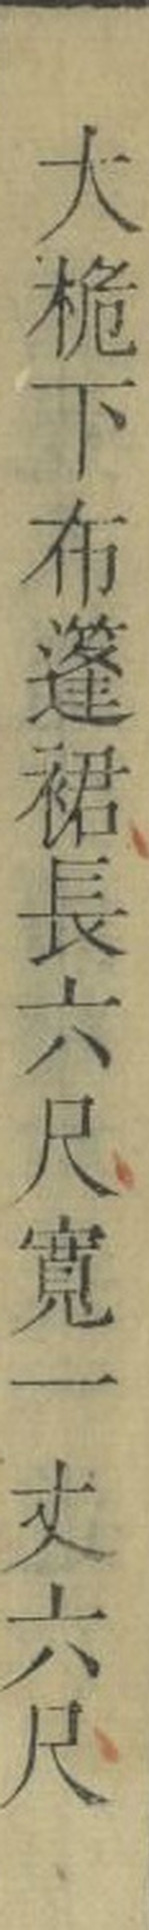大桅下布篷裙長六尺寬一丈六尺
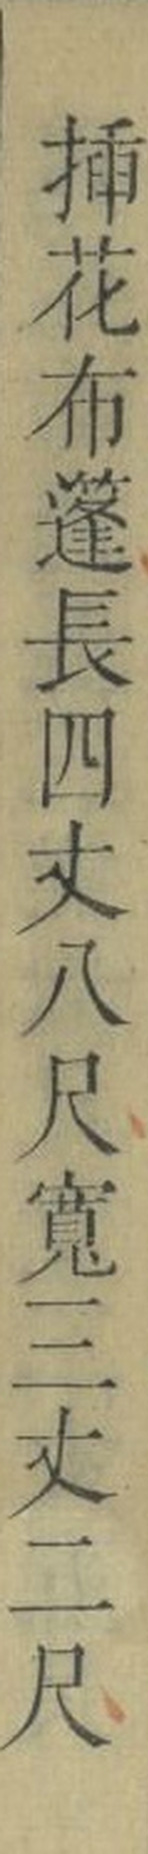揷花布篷長四丈八尺寬三丈二尺
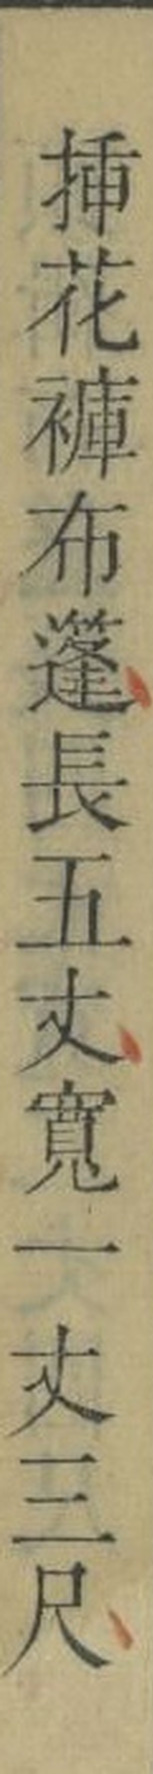揷花褲布篷長五丈寬一丈三尺

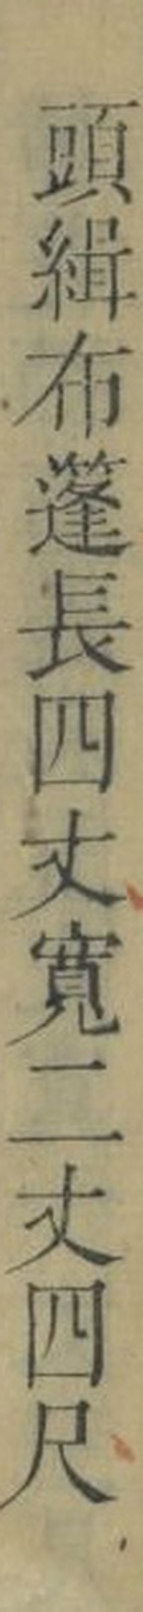頭緝布篷長四丈寬二丈四尺
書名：中山伝信録 巻一、巻二
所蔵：University of the Ryukyus Library
